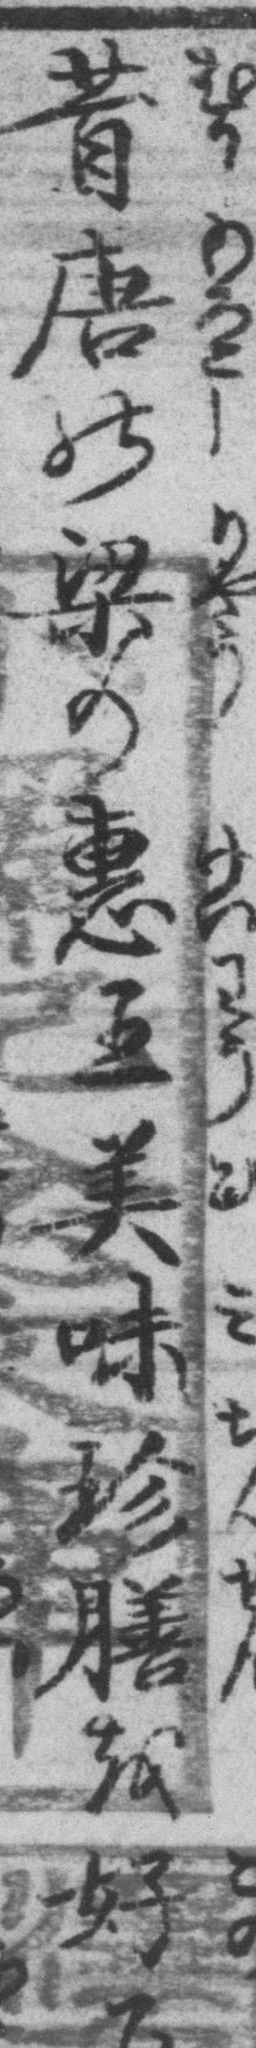昔唐の梁の恵王美味珍膳を好み
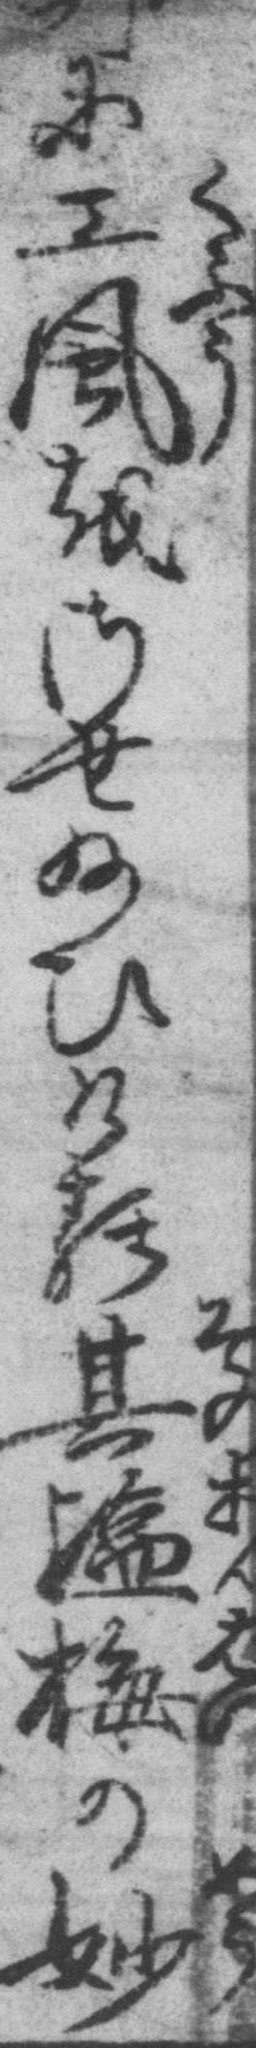烹割に工風をさせ給ひける其塩梅の妙
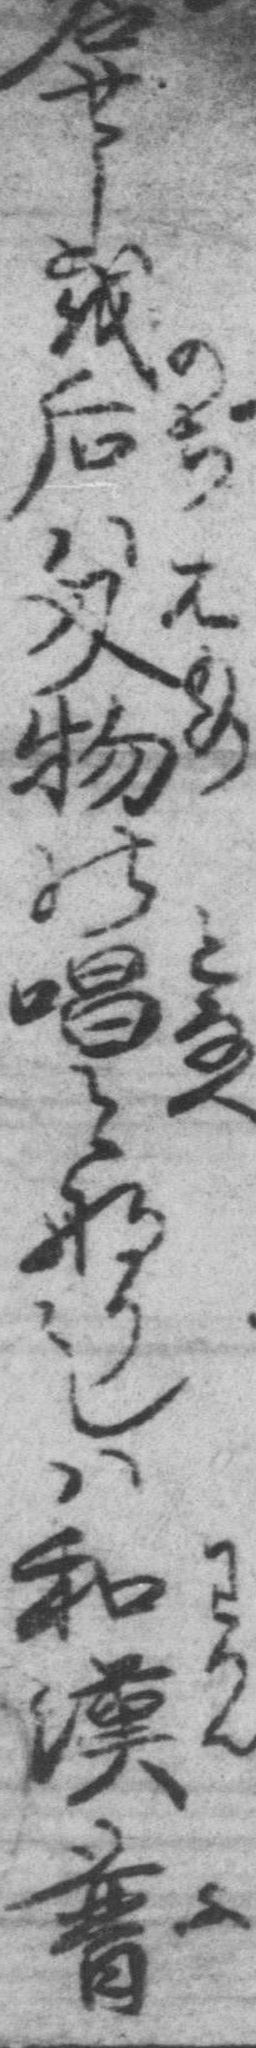と渾名せしを后は刃物の唱となりしは和漢普
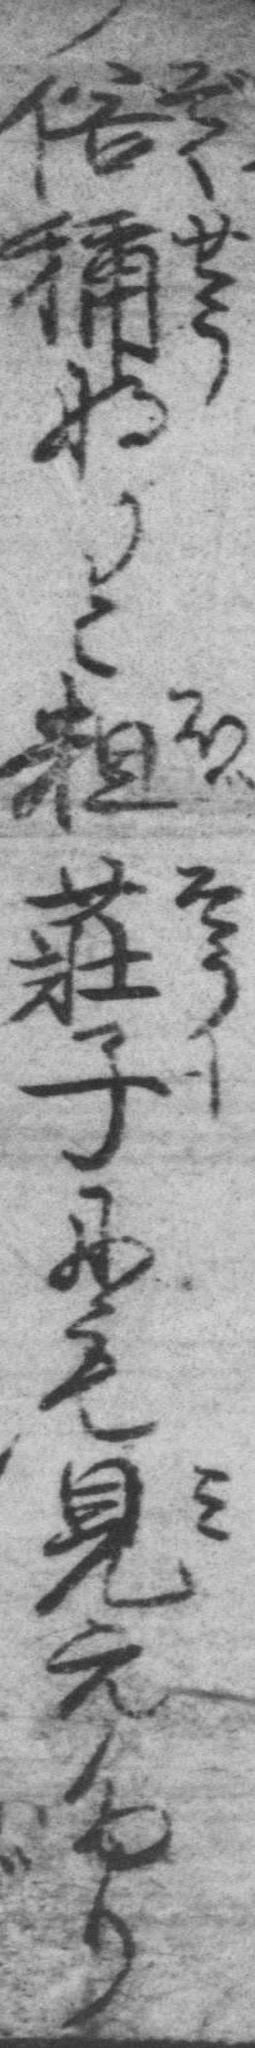通の俗称なりと粗荘子にも見えたり
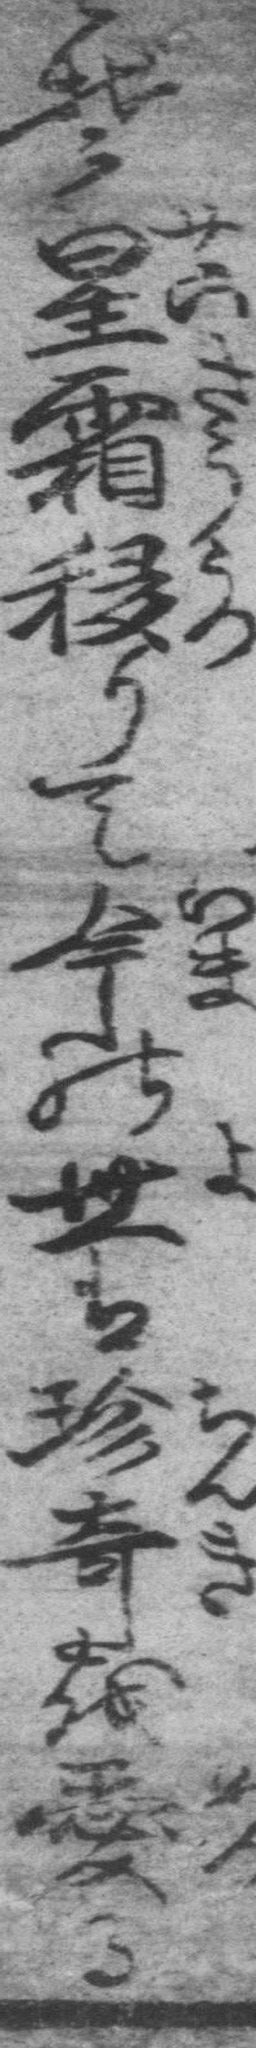とそ星霜移りて今の世に珍奇を愛る

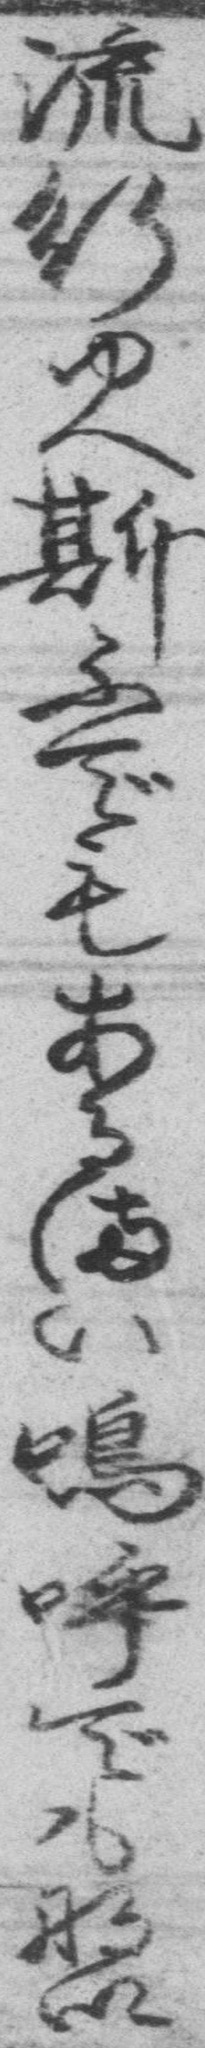流行ゆへ斯ふでもあるまい嗚呼でもない
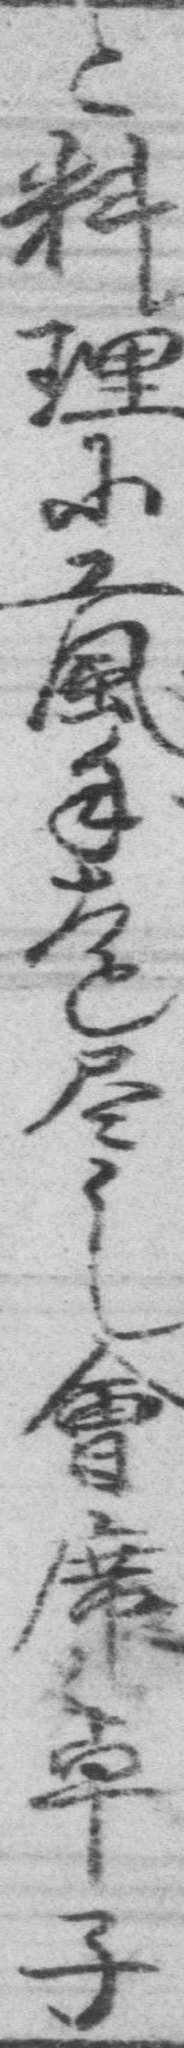と料理に工風手を尽し会席の卓子
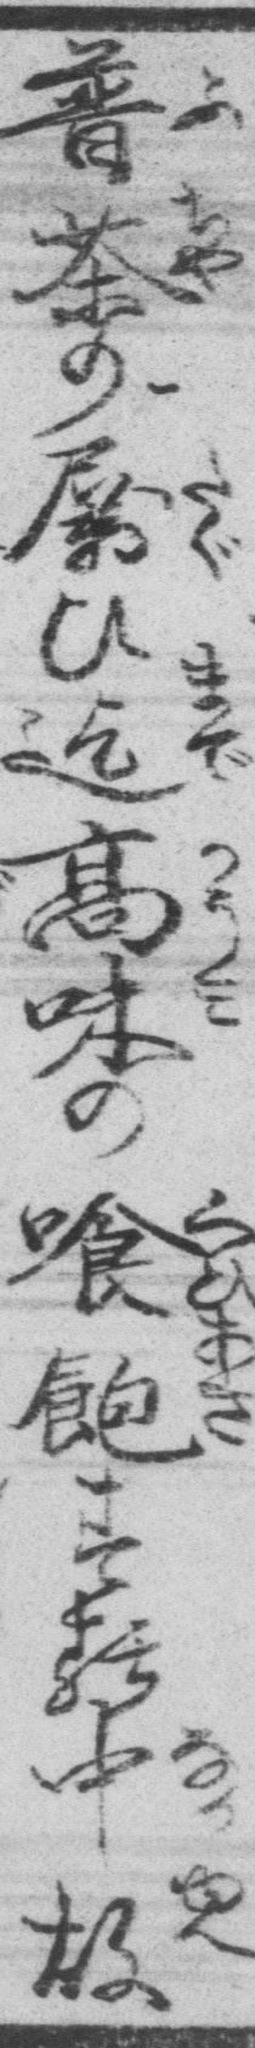普茶の類ひ迄高味の喰飽する中故
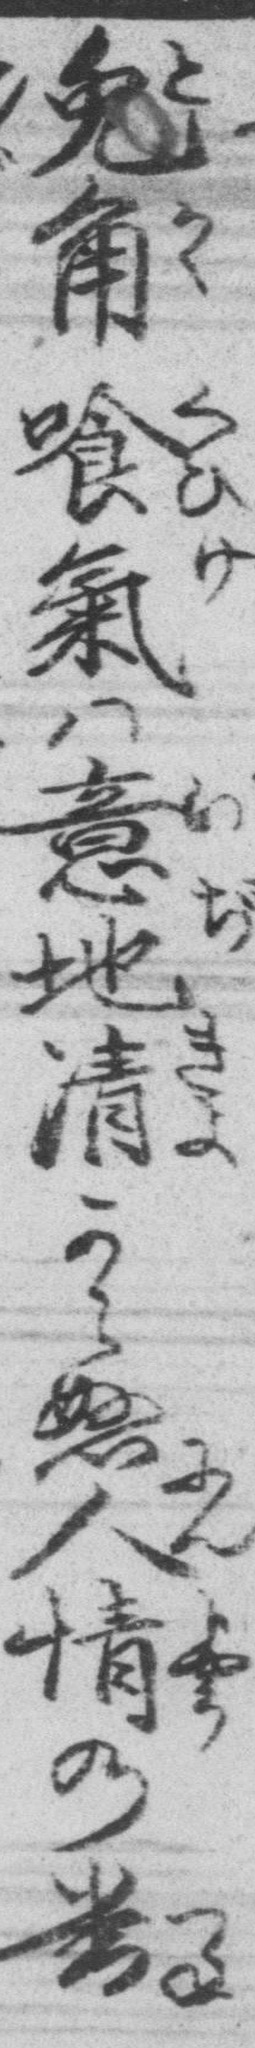兎角喰気は意地清からぬ人情の常
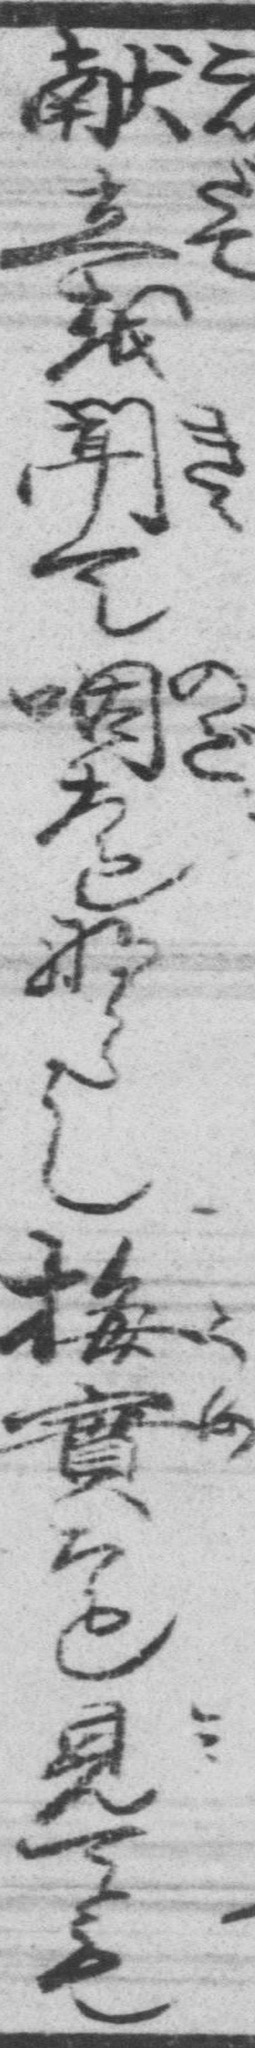献立を聞て咽をならし梅実を見ても
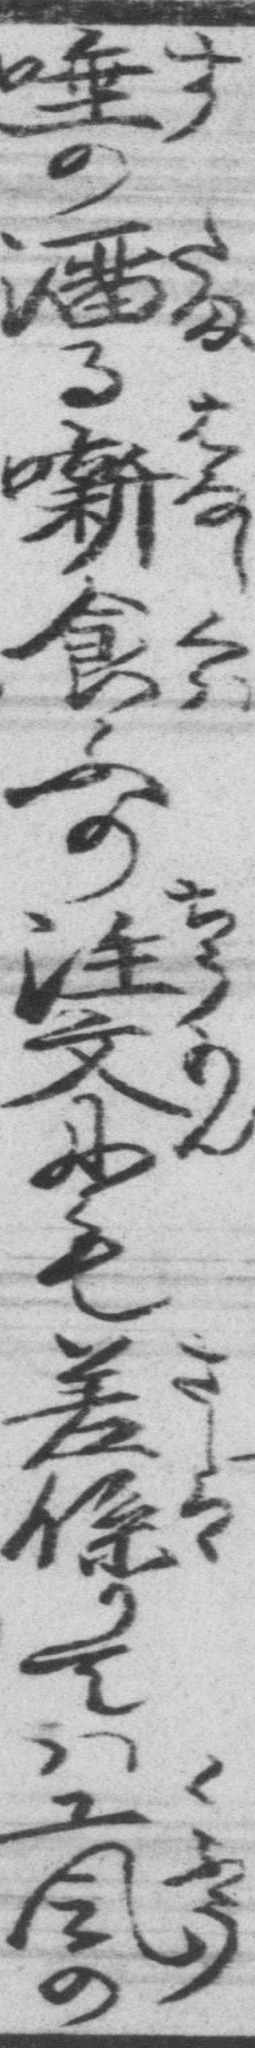唾の溜る噺食ふの注文にも差係りては工風の
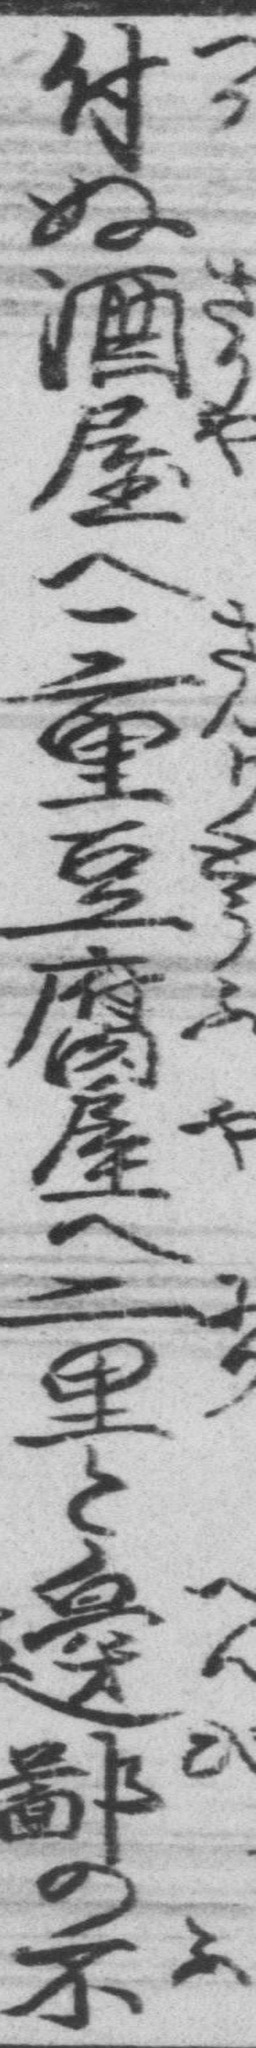付ぬ酒屋へ三里豆腐屋へ二里と辺鄙の不
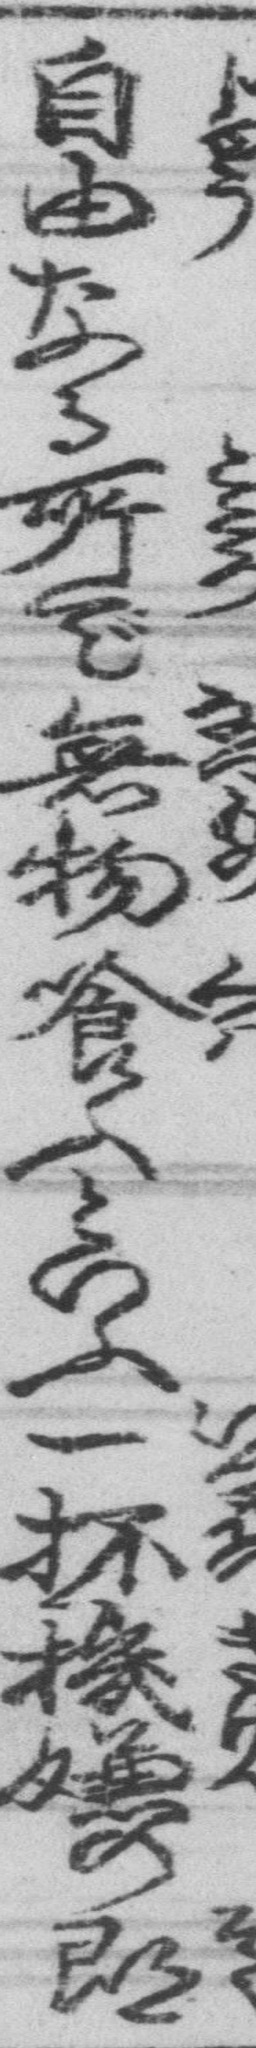自由なる所で無物喰ふといふ一杯機嫌の即
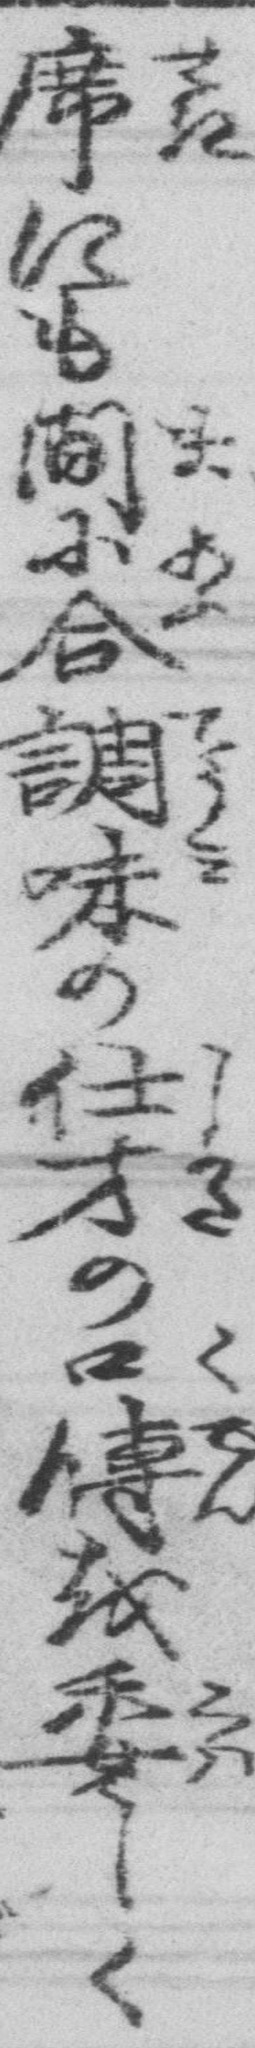席にも間に合調味の仕方の口伝を委しく
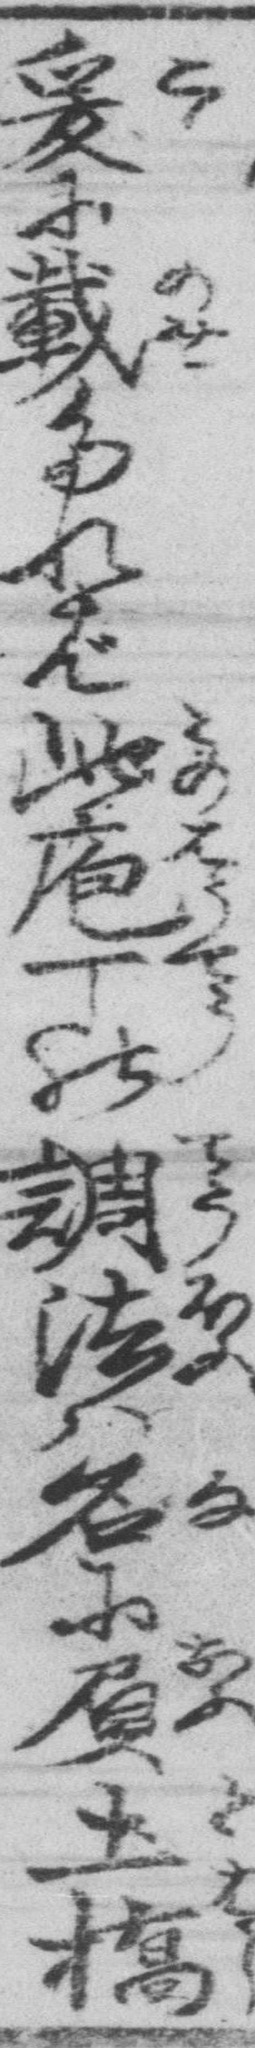爰に載たれば此包丁の調法は名に負土橋
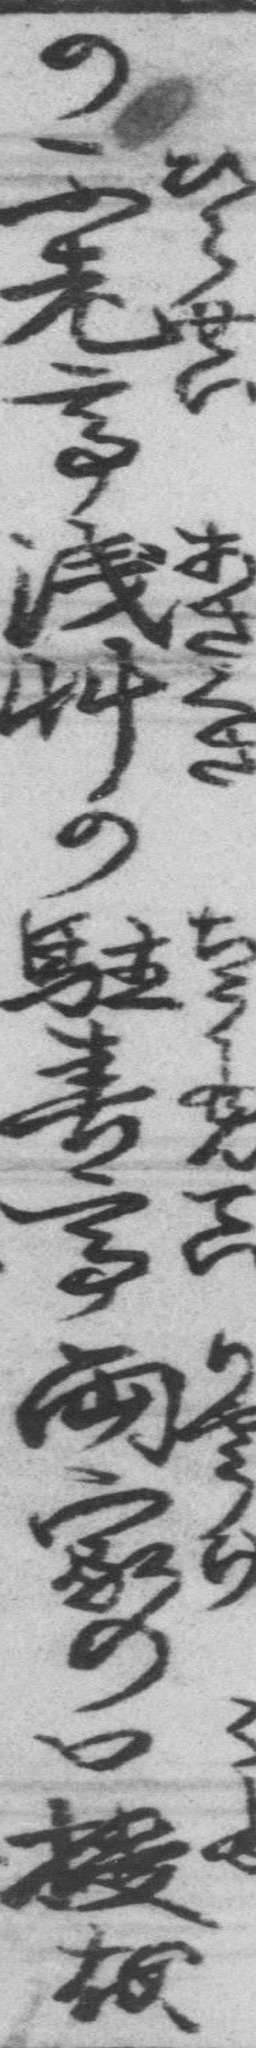の不老亭浅草の駐春亭両家の口授を
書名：即席庖丁
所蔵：大阪府立大学学術情報センター 国文学研究資料館
